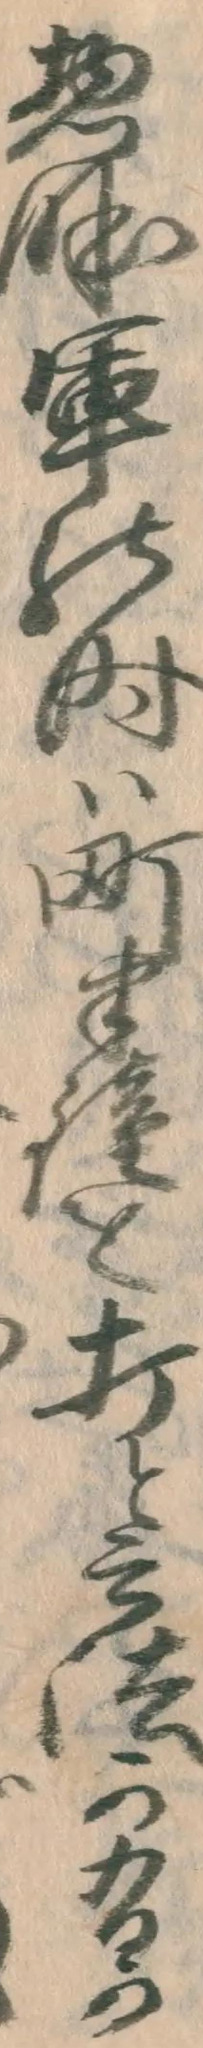惣体軍の時ハ町半鐘を打と云法か有か
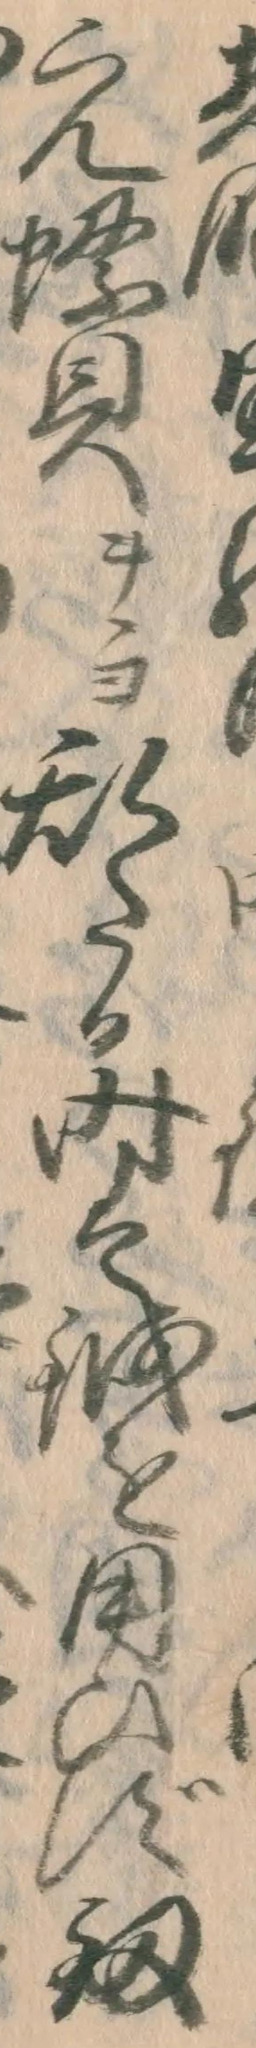え螺貝ヲゝヨ乱たる時は鉞を用ひず釼
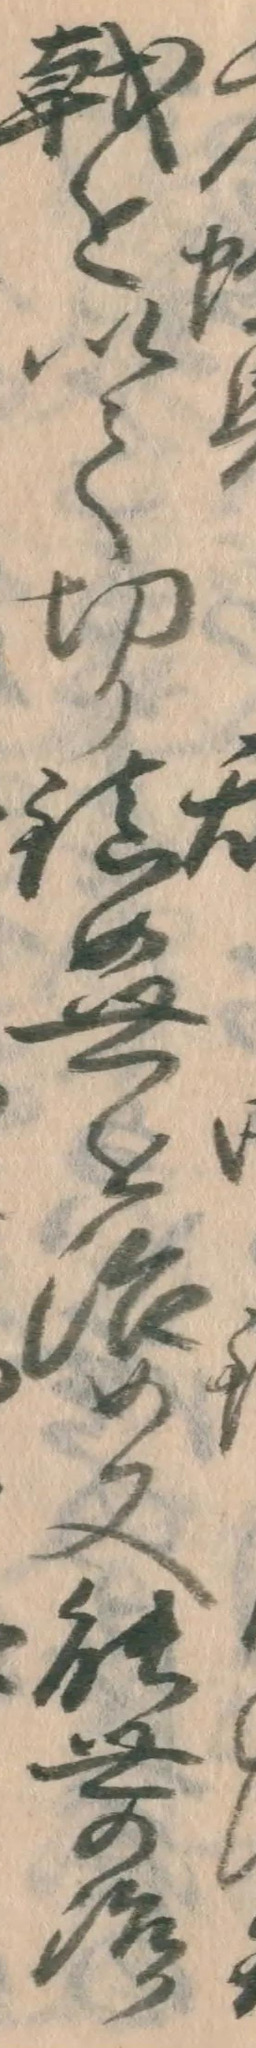戟を以て切り鎮め世を治め又能世の治り
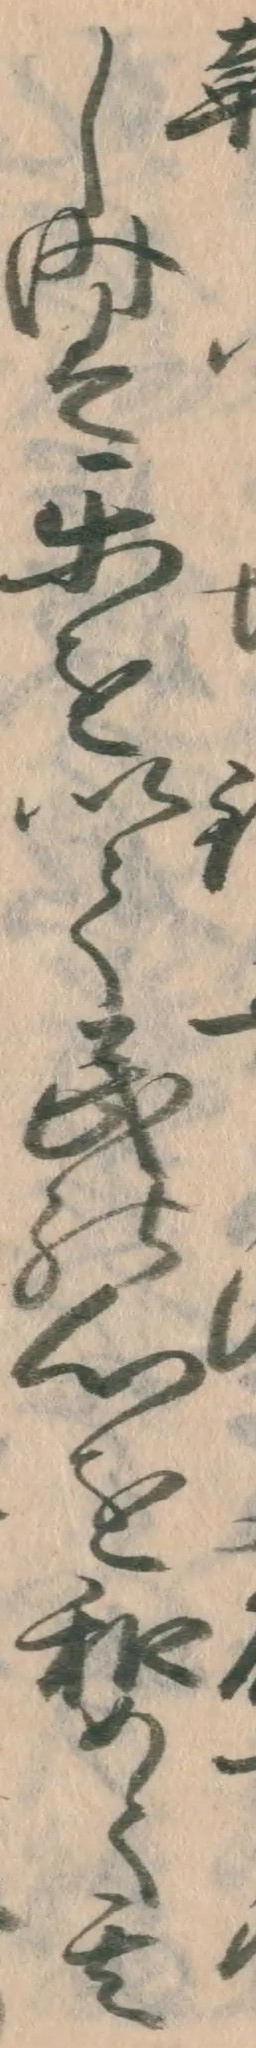し時は楽を以て民の心を和めて其
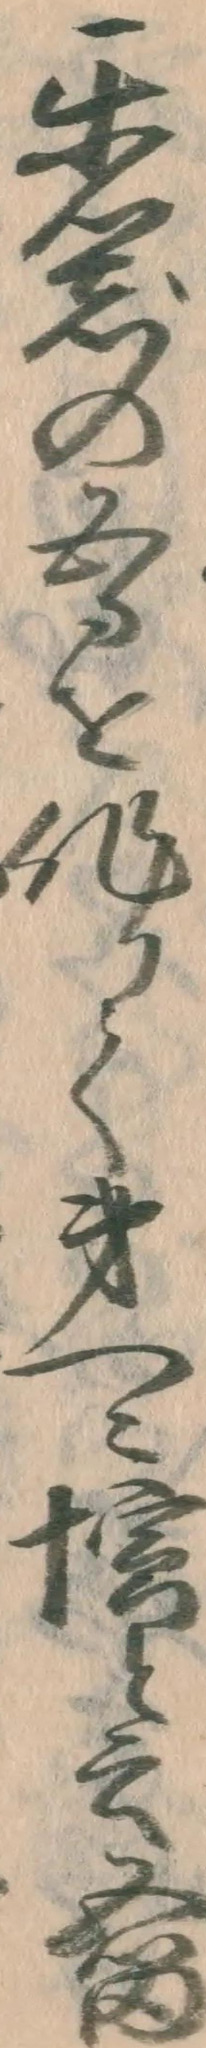楽器の五ツを作りて第一ニ演と云五笛
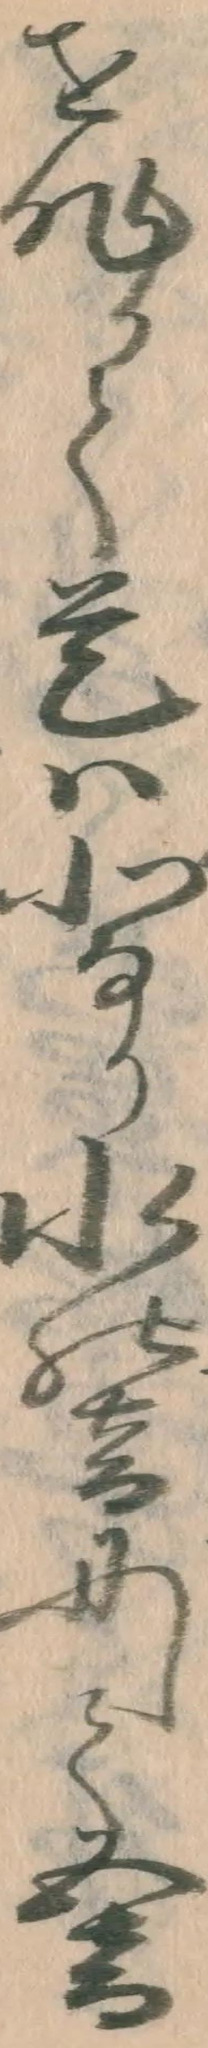を作りて是ハ北なり水の音にして五音
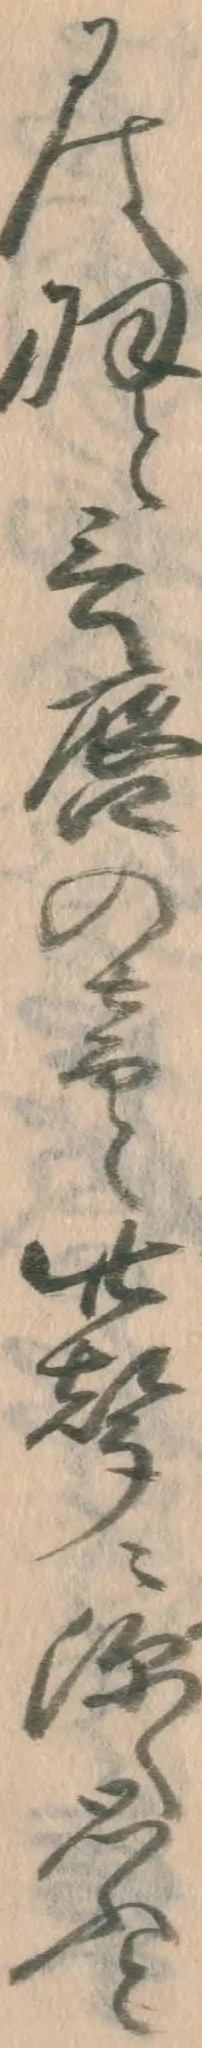には羽と云唇の音と此聲ニ深く思ふと
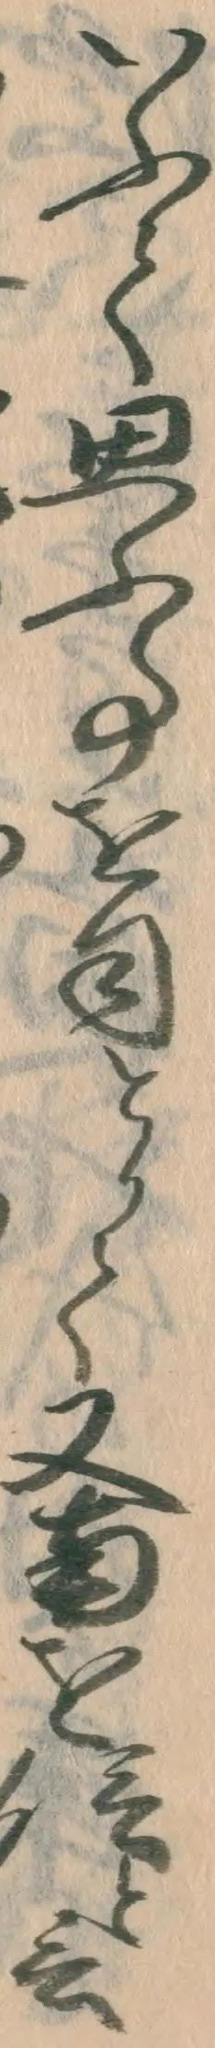いふて思ふ事を司とりて又南を信と云
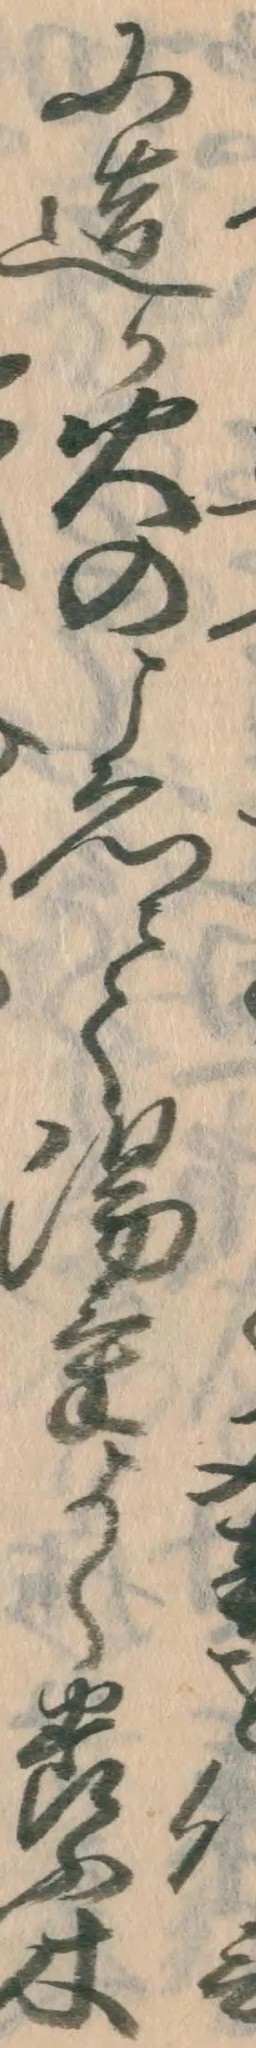に造り火のこゑニて陽氣よく養ふ木
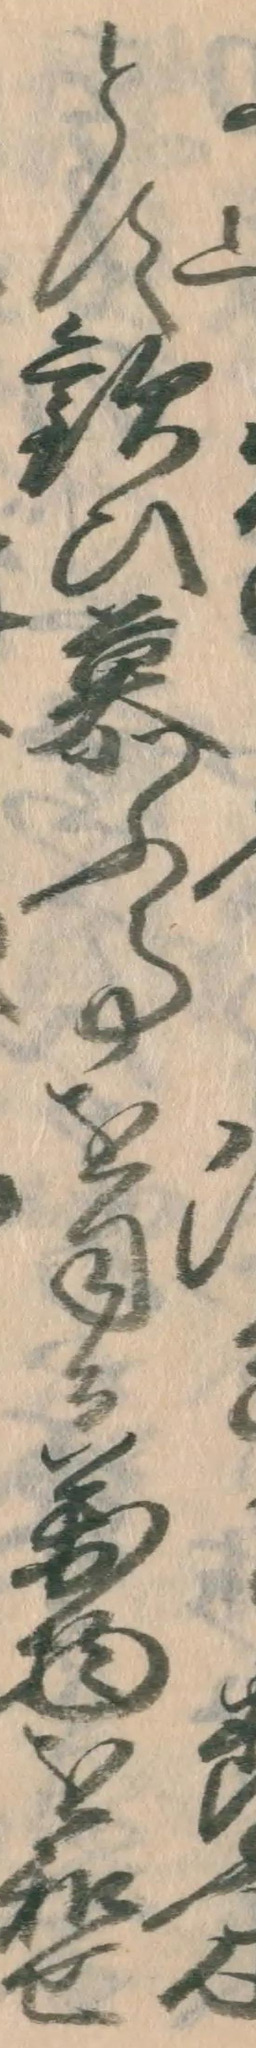とす歓ひ慕ふ事を司る萬物を和せ
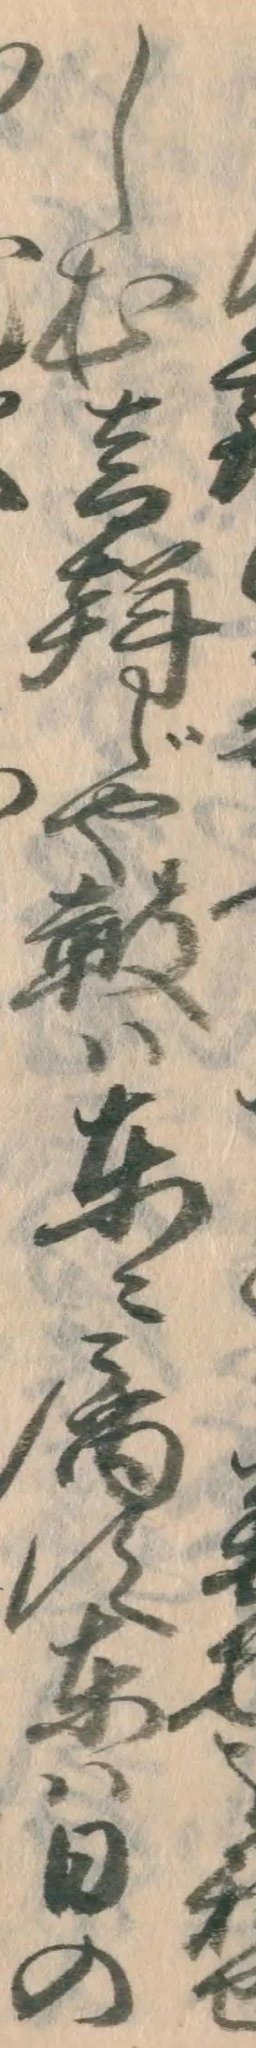しむ音拜じや敢ハ東ニ属す東ハ日の
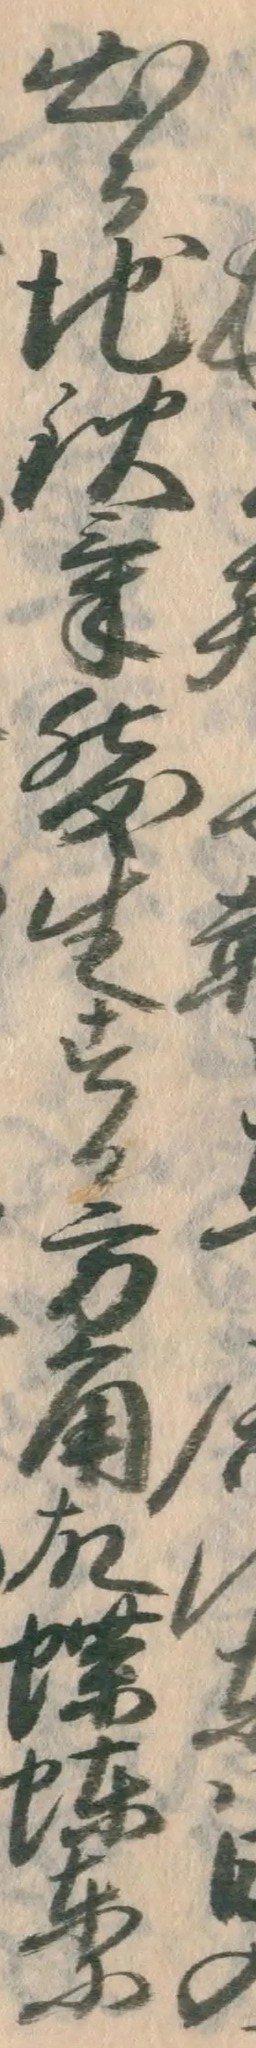出る地秋氣発生する方角故蝶蝀東に
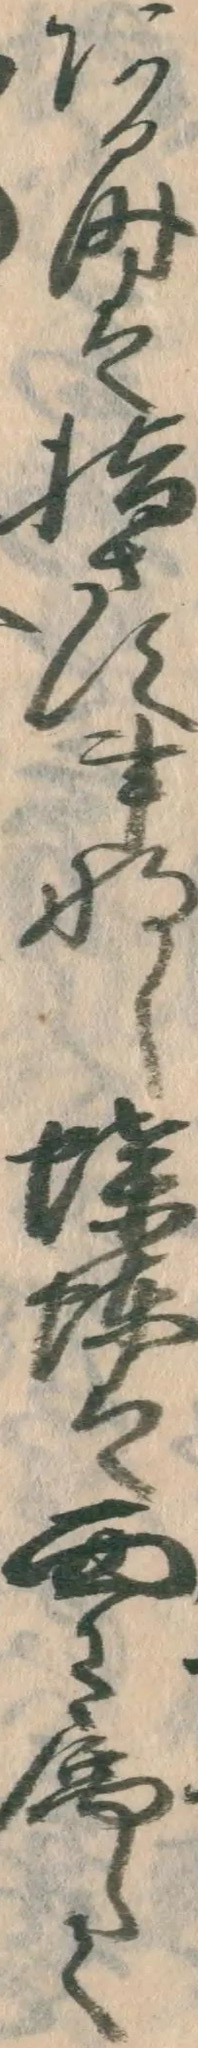ある時は指さす事なし蝶蝀は西に属して
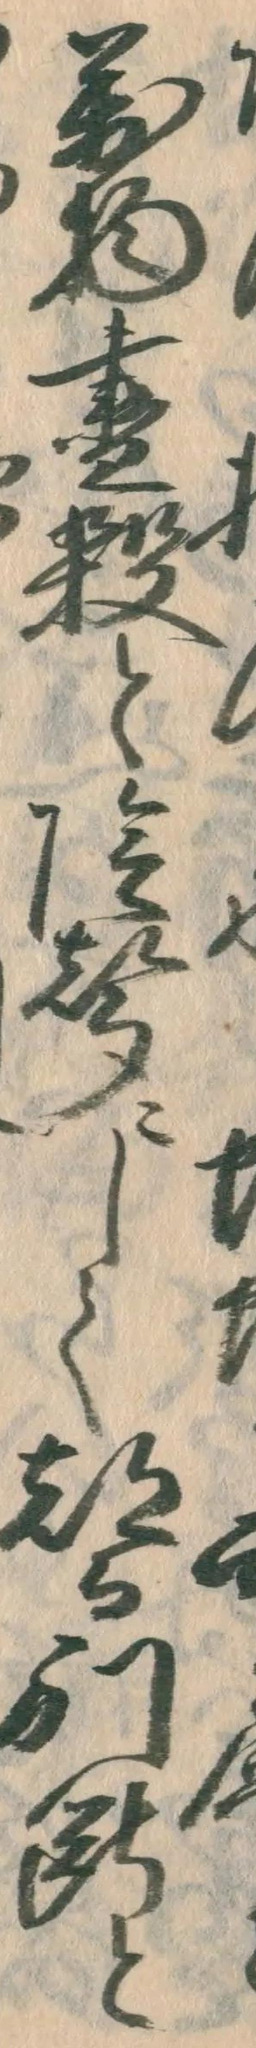萬物盡殺と陰聲ニして都而別断と
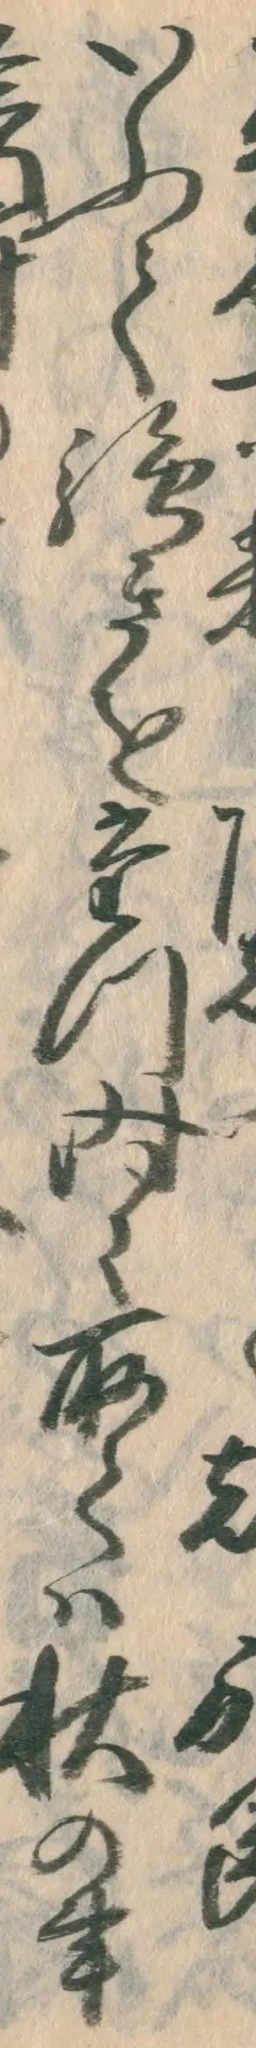いふて強さをたつ時に取てハ秋の事
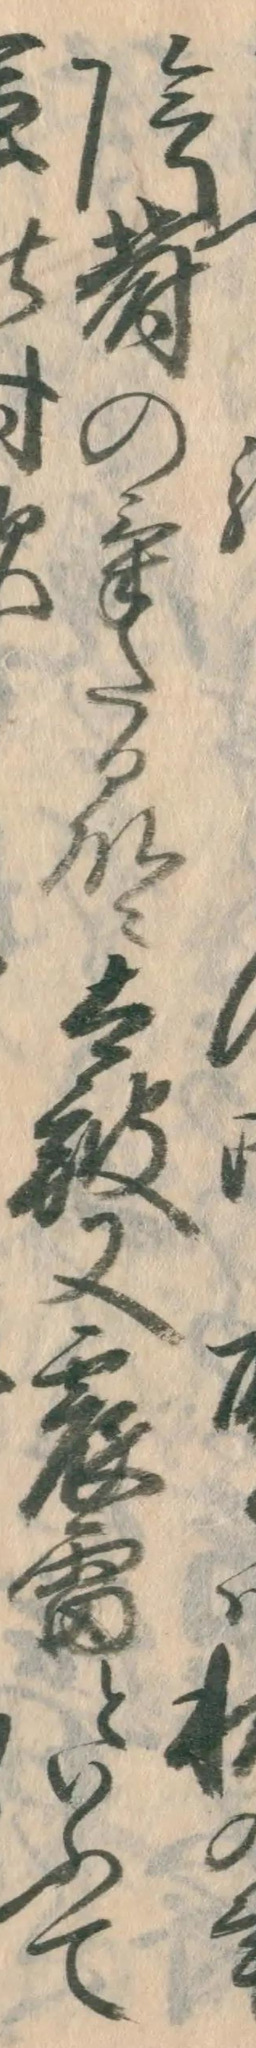陰鬱の氣たる故ニ太鼓又震雷といふて
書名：麗斎叢書. 20
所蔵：国立国会図書館 National Diet Library, JAPAN
